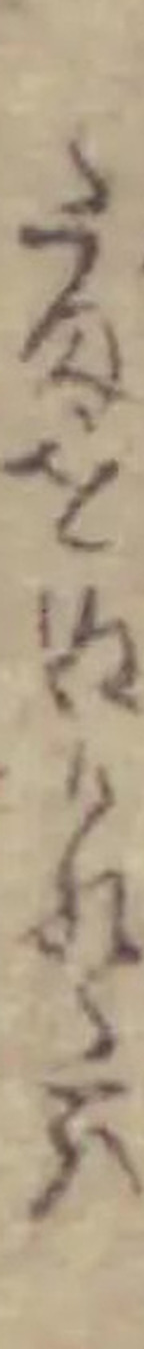たまをぬかれたは
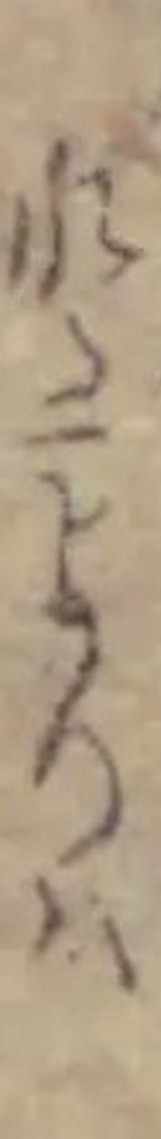れたよりは
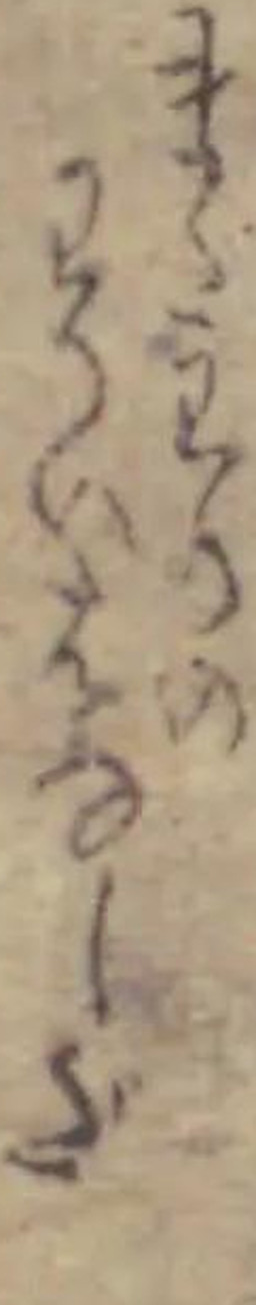わりいはなしだ
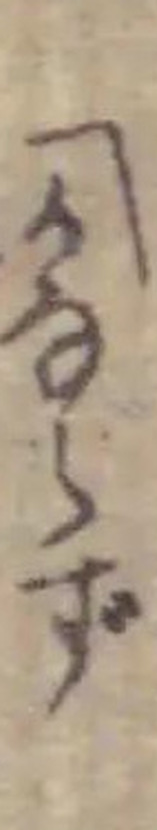〽かならず
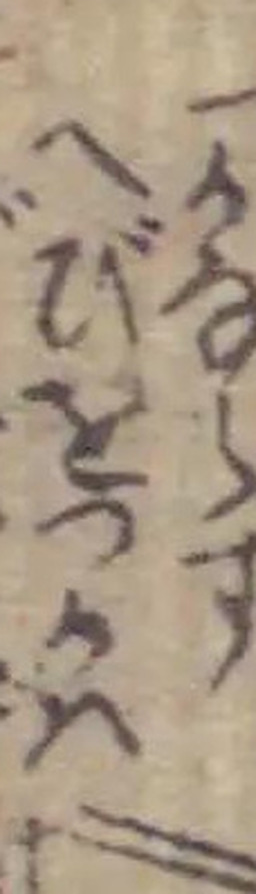へびをつかは
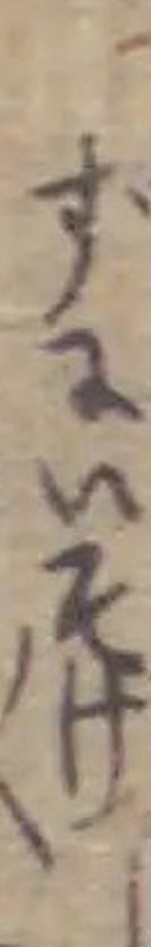ずにいそげ

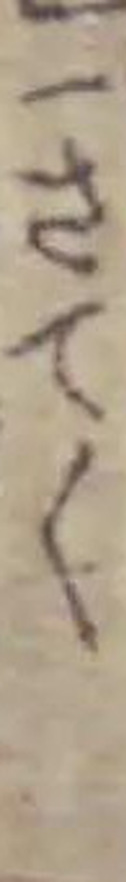〽さて〳〵
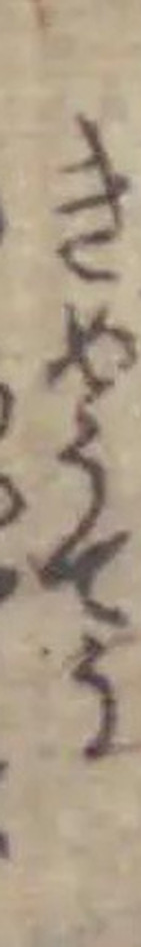きめうてう
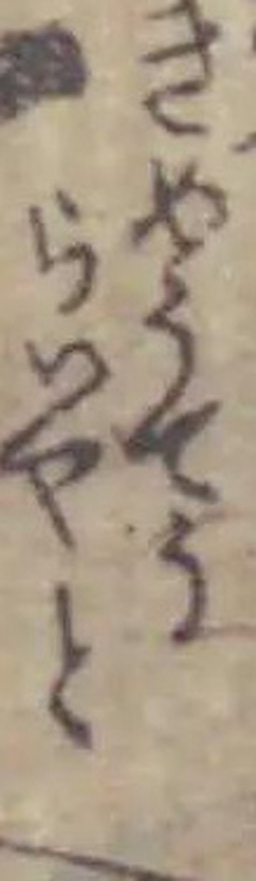らいやと
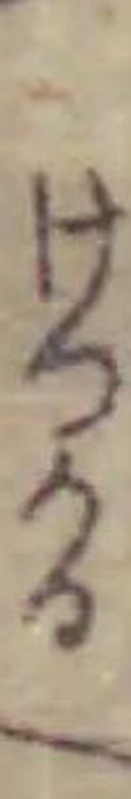けつかる
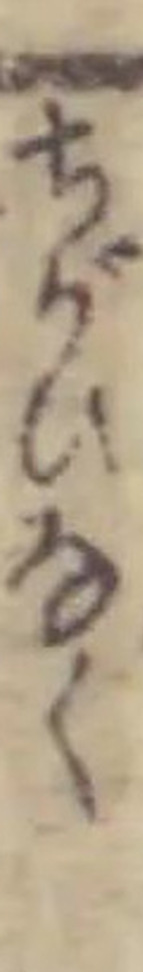ちがひなく
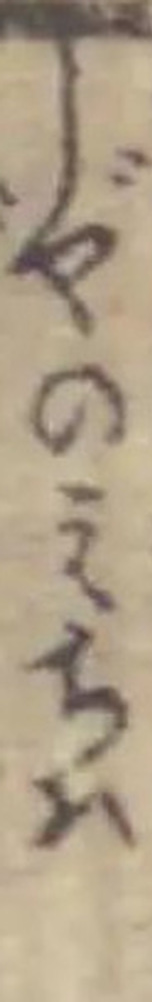じやのみちは
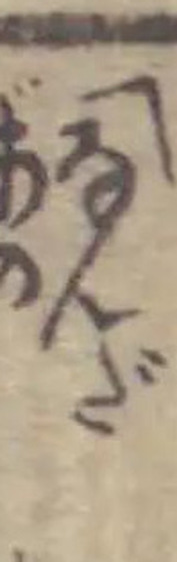〽なんだ
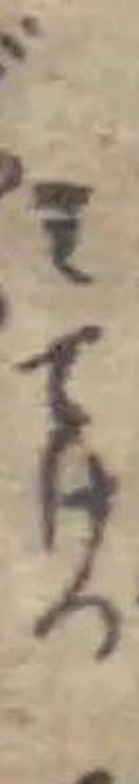みてけつ
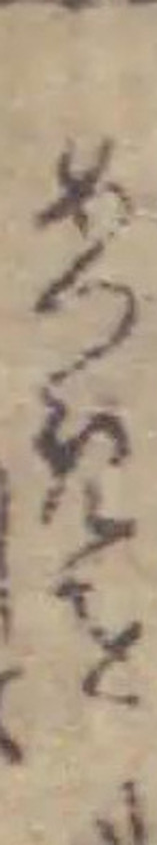めつきを
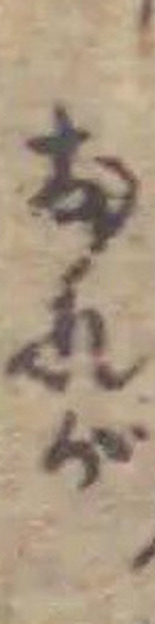おれが
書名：化物太平記 3巻
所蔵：国立国会図書館 National Diet Library, JAPAN
